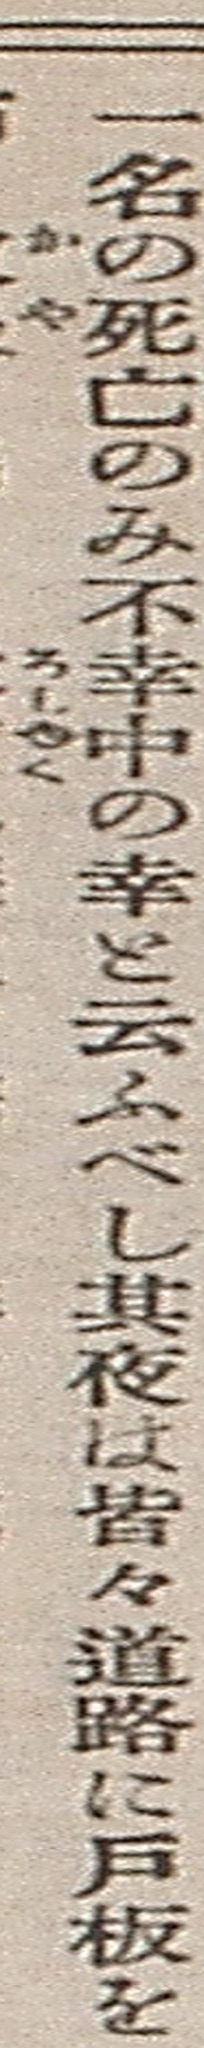一名の死亡のみ不幸中の幸と云ふべし其夜は皆々道路に戸板を
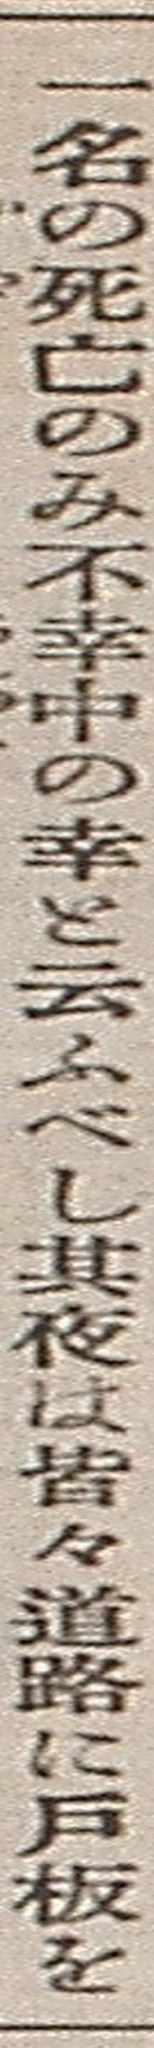一名の死亡のみ不幸中の幸と云ふべし其夜は皆々道路に戸板を
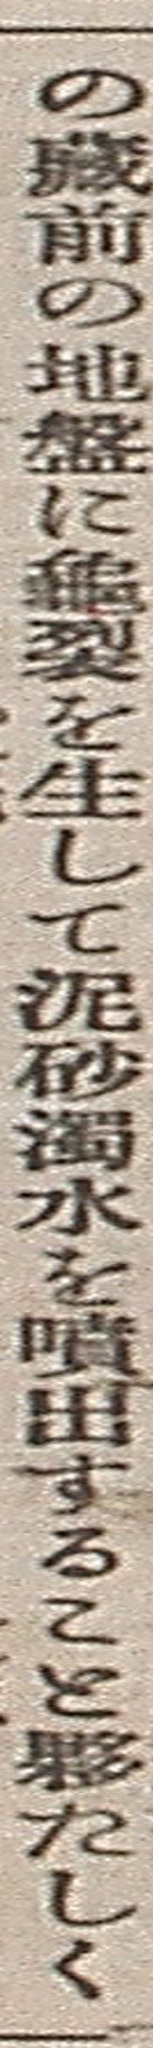の蔵前の地盤に亀裂を生して泥砂濁水を噴出すること夥たしく
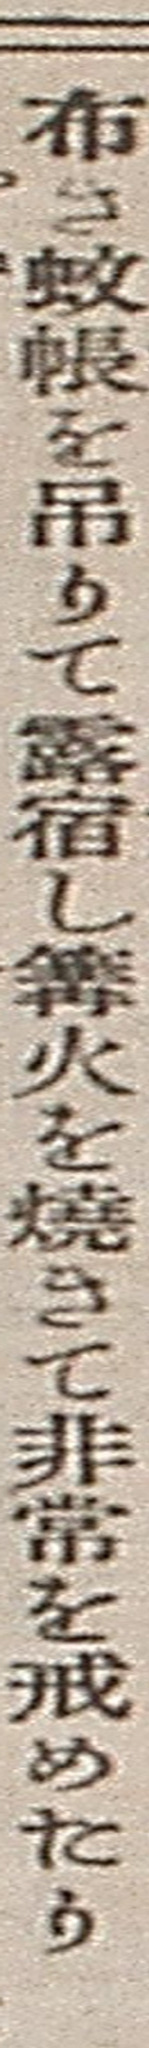布き蚊帳を吊りて露宿し篝火を焼きて非常を戒めたり
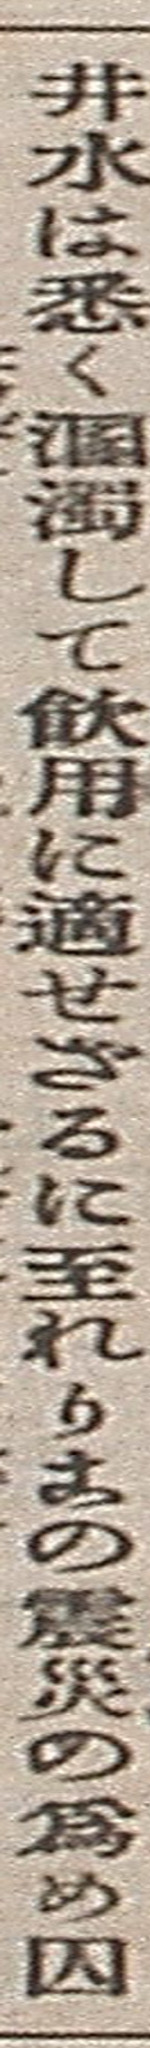井水は悉く混濁して飲用に適せざるに至れりこの震災の為め囚
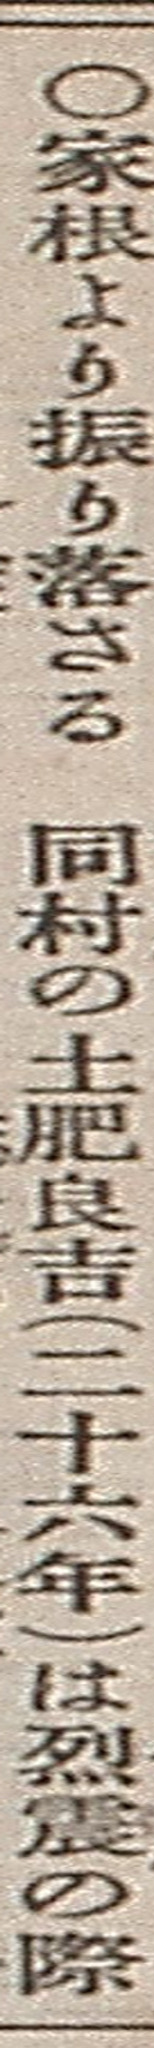〇家根より振り落さる同村の土肥良吉は烈震の際
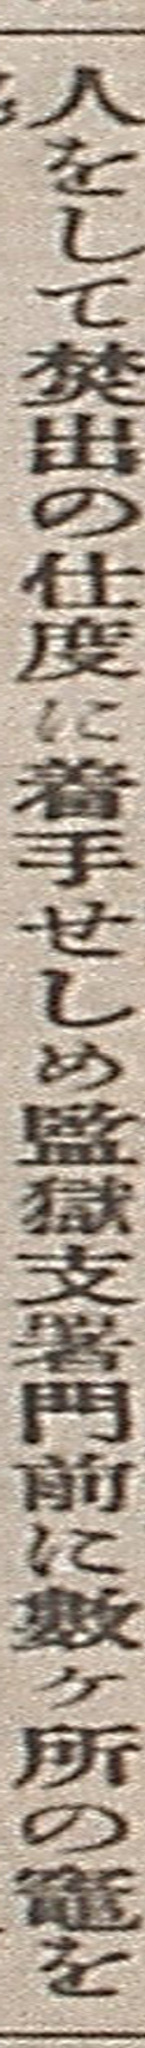人をして焚出の仕度に着手せしめ監獄支署門前に数ケ所の竃を
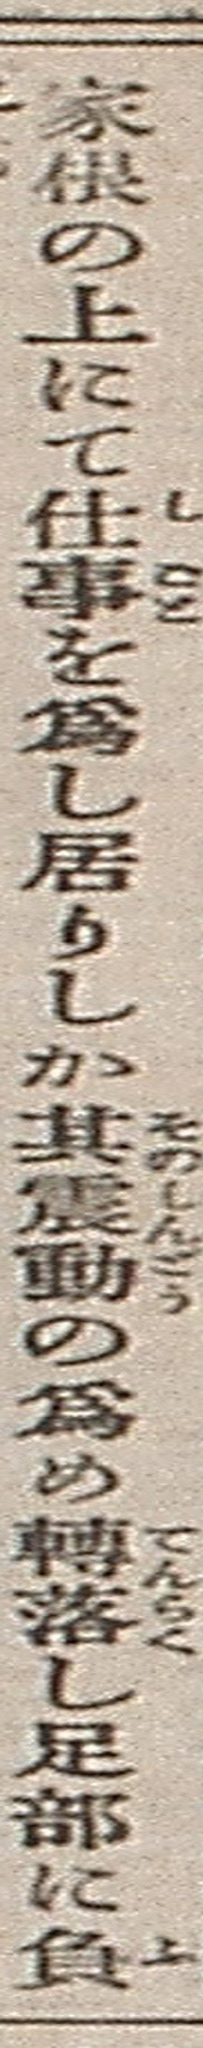家根の上にて仕事を為し居りしか其震動の為め転落し足部に負
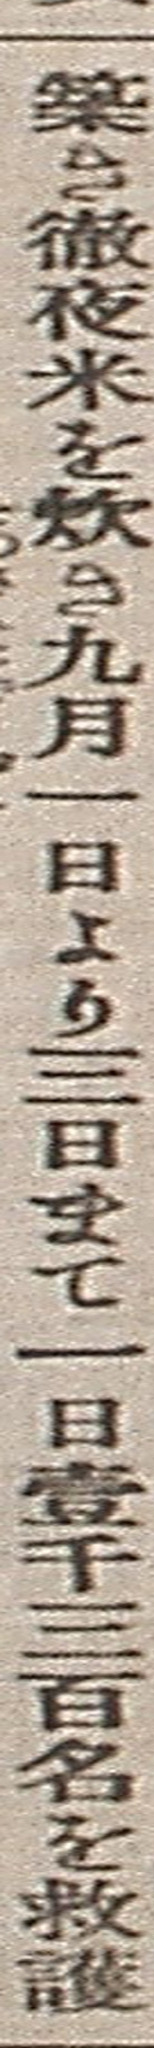築き徹夜米を炊き九月一日より三日まて一日壱千三百名を救護
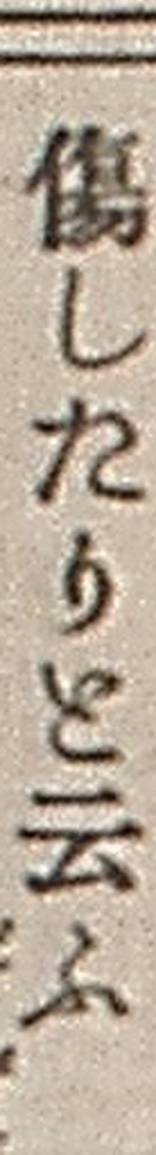傷したりと云ふ
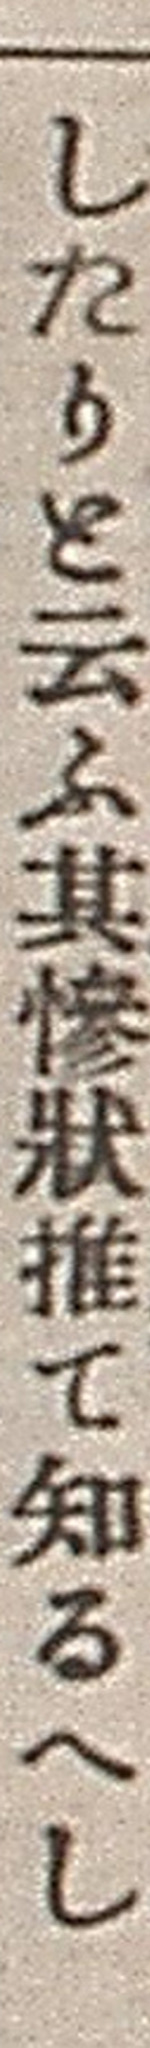したりと云ふ其惨状推て知るへし
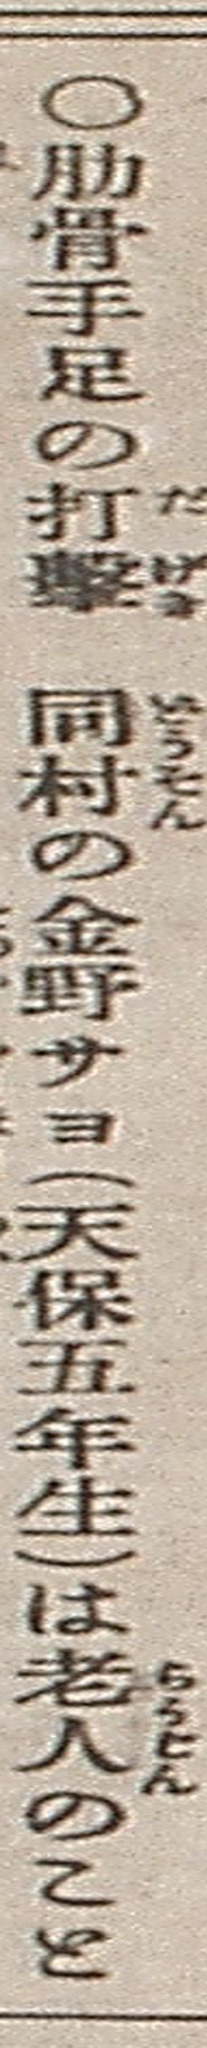〇肋骨手足の打撃同村の金野サヨは老人のこと
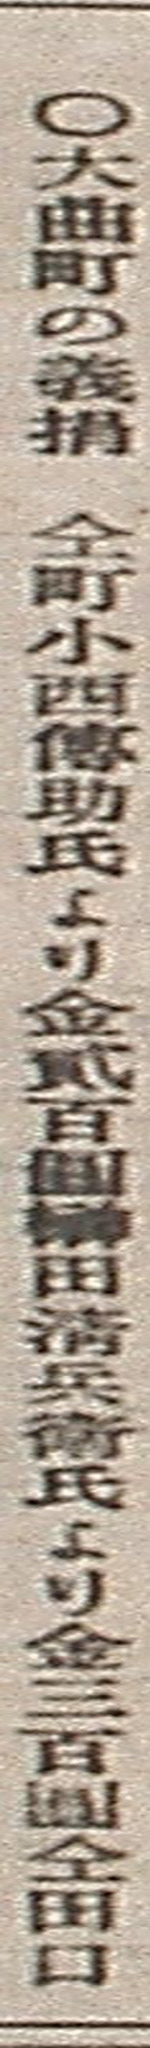〇大曲町の義捐仝町小西伝助氏より金弐百円榊田清兵衛氏より金三百円仝田口
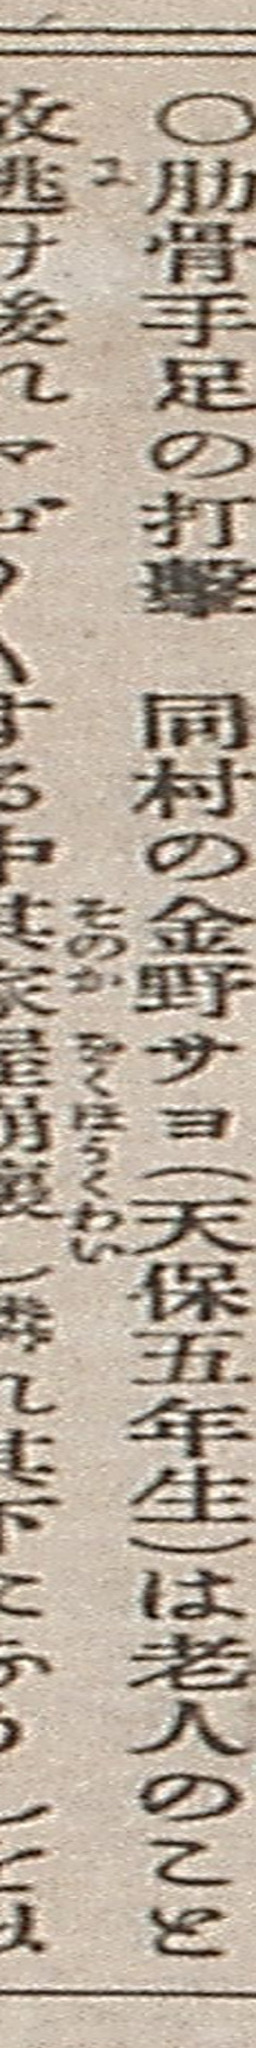故逃け後れマゴ〳〵する中其家屋崩壊し憐れ其下になりしを以
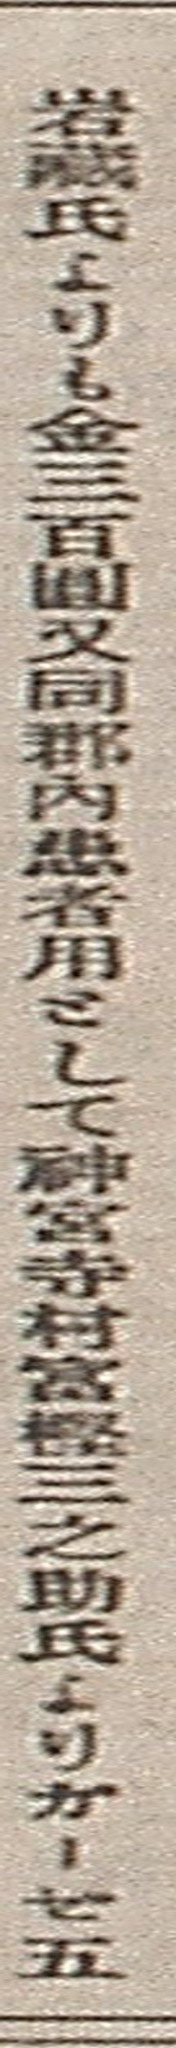岩蔵氏よりも金三百円又同郡内患者用として神宮寺村富樫三之助氏よりガーゼ五
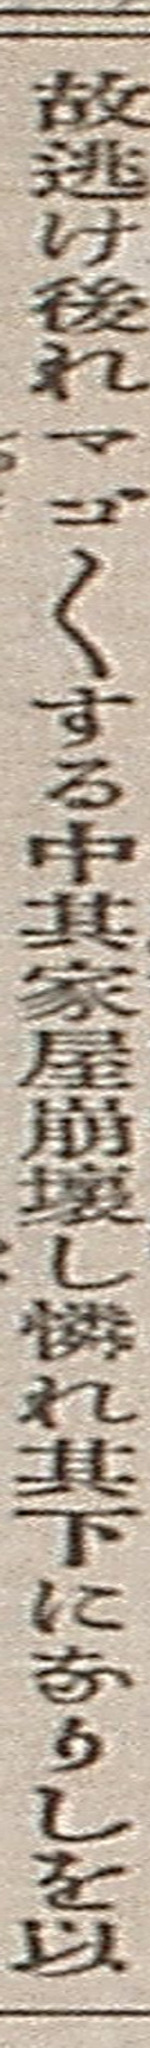故逃け後れマゴ〳〵する中其家屋崩壊し憐れ其下になりしを以
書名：風俗畫報臨時増刊第百二十四號　洪水地震被害録（上）
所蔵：東京大学地震研究所図書室 Earthquake Research Institute Library, The University of Tokyo, JAPAN
